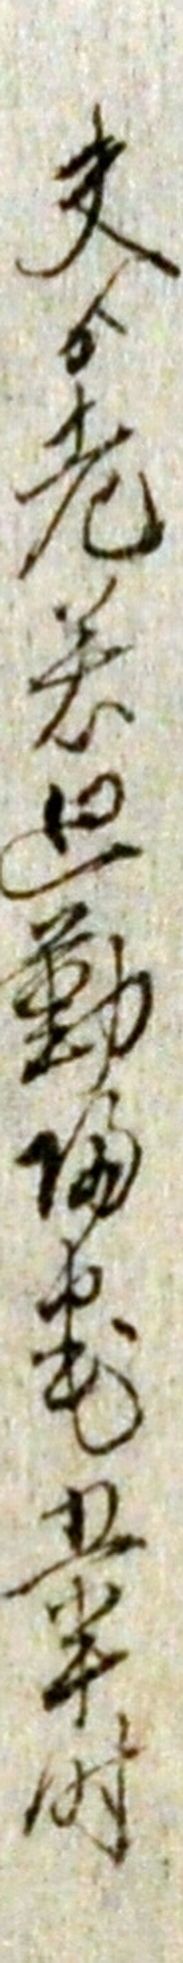夫ゟ老若廻勤帰宅五半時
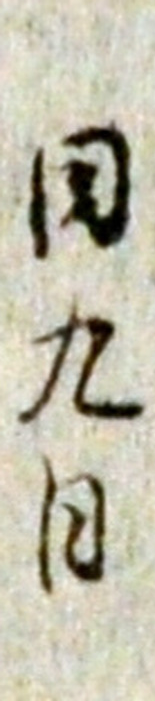同九日
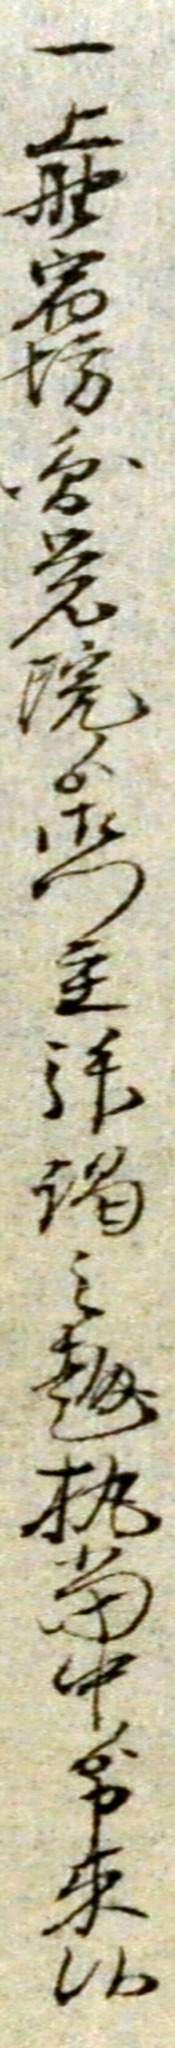一上野宿坊圓覚院御門主拝謁之執當中ゟ申来候
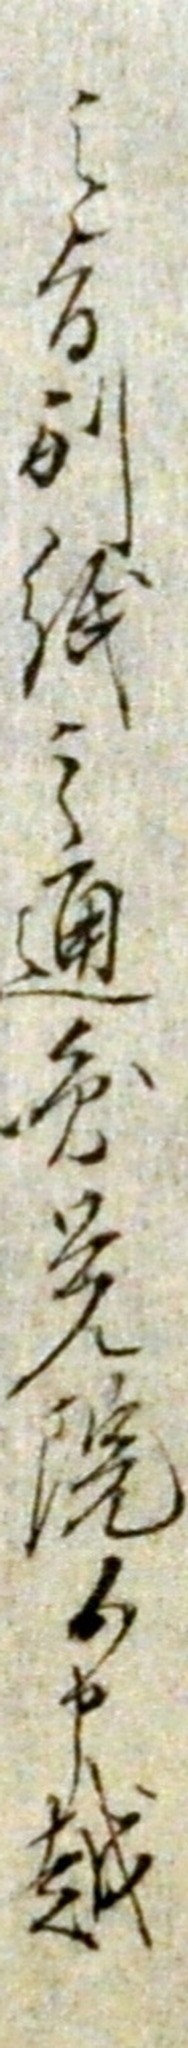之旨別紙之通圓覚院ゟ申越
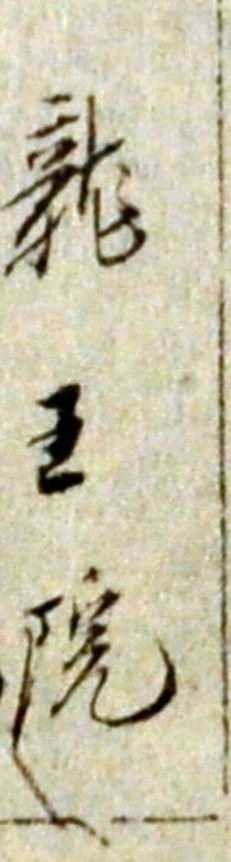竜王院
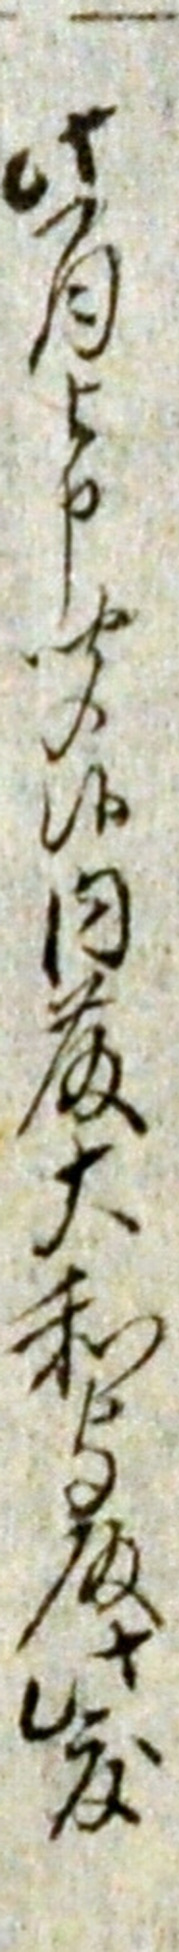此間ヒ申聞候内藤大和守殿此度
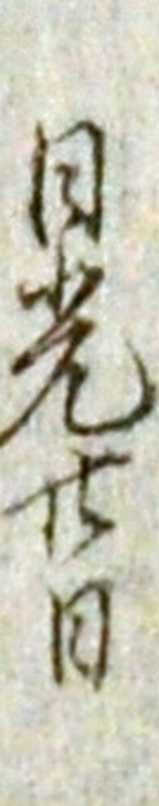日光廿日
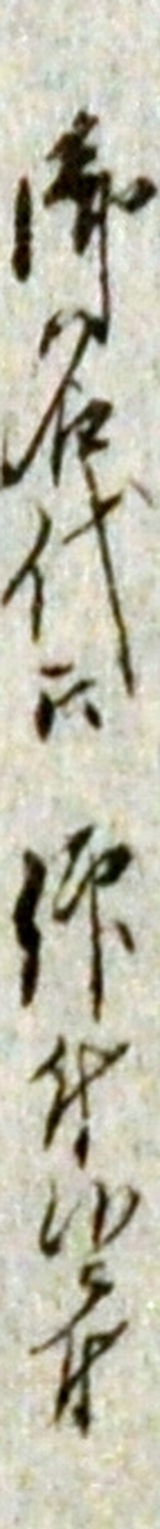御名代被仰付候ニ付
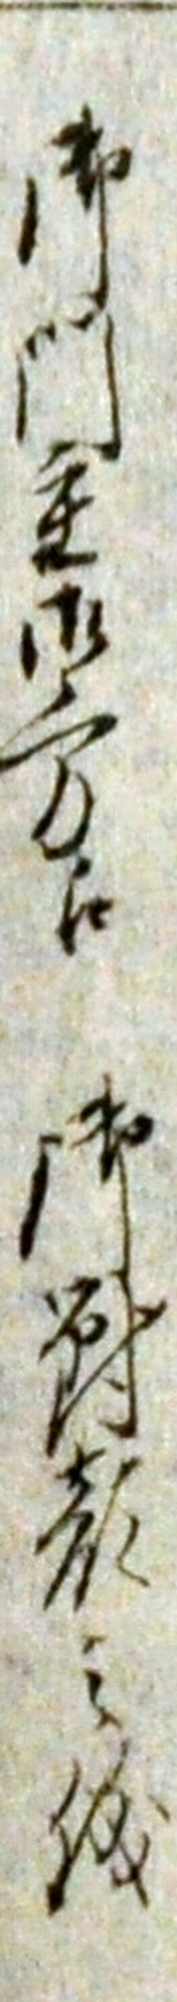御門主御方江御対顔之儀
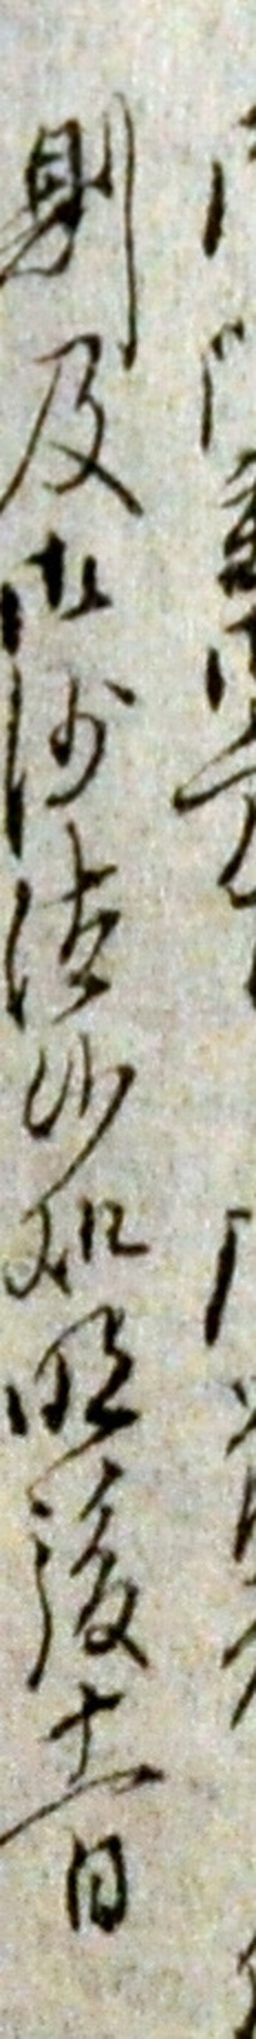側及御沙汰候処明後十一日

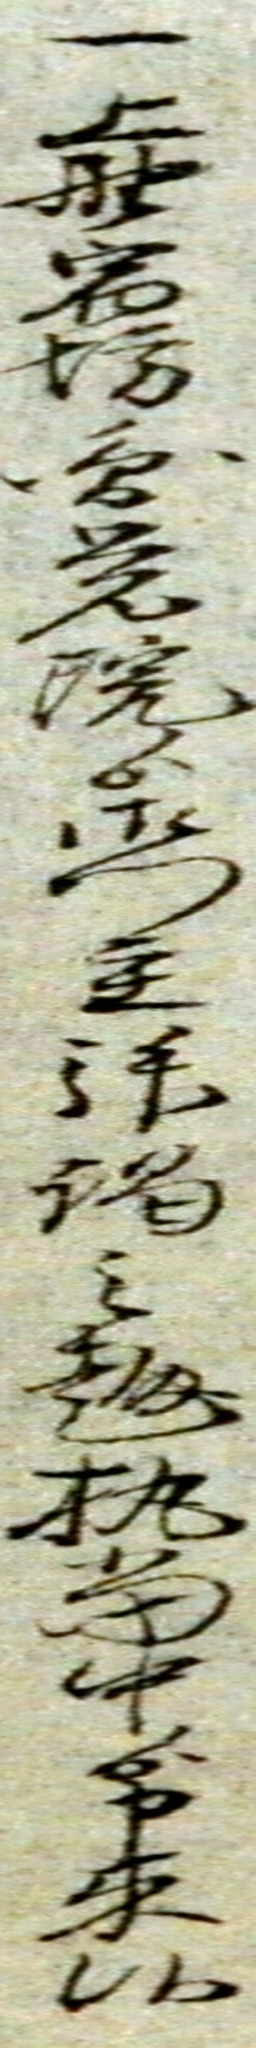一上野宿坊圓覚院ゟ御門主拝謁之趣執當中ゟ申来候
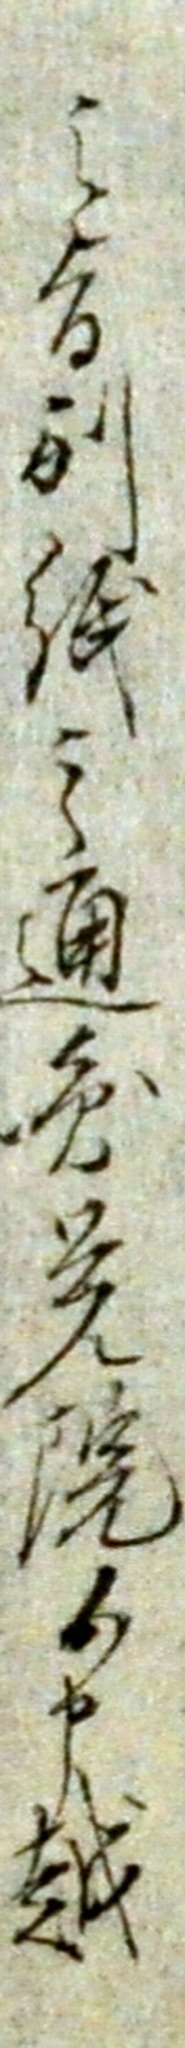之旨別紙之通圓覚院ゟ申越
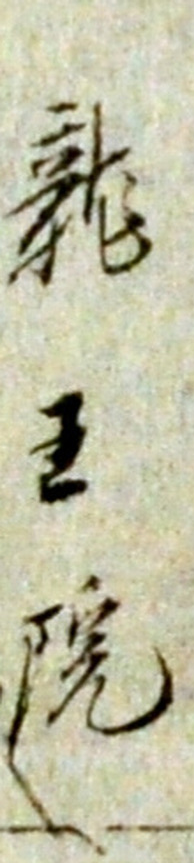竜王院
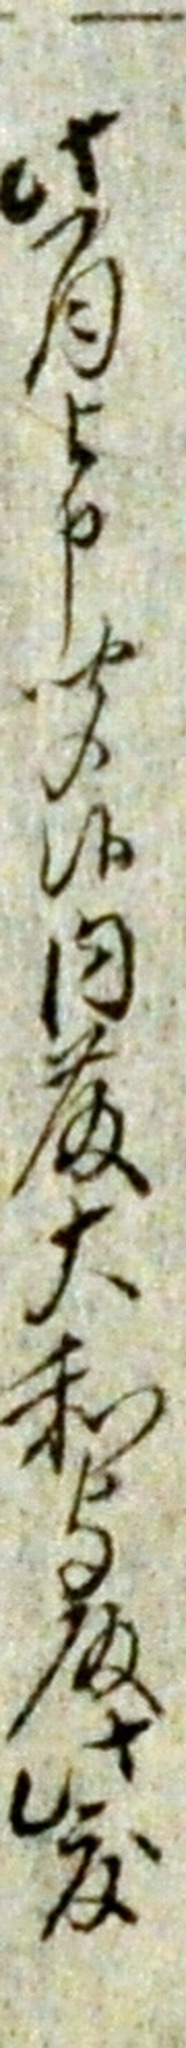此間ㇶ申聞候内藤大和守殿此度
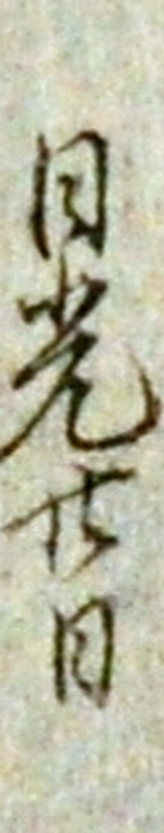日光廿日
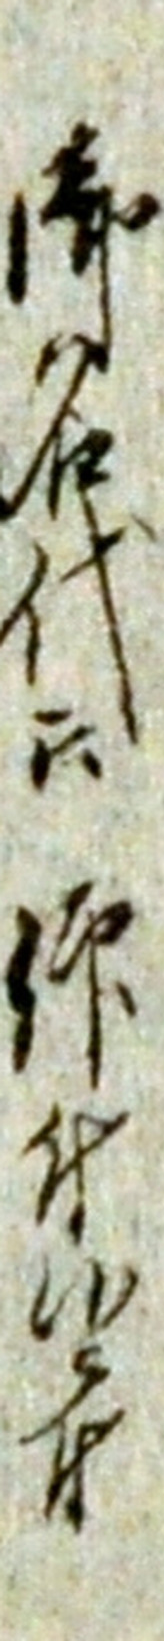御名代被仰付候ニ付
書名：日光御名代相勤候節ノ留
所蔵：伊那市立高遠町図書館・合同会社AMANE
